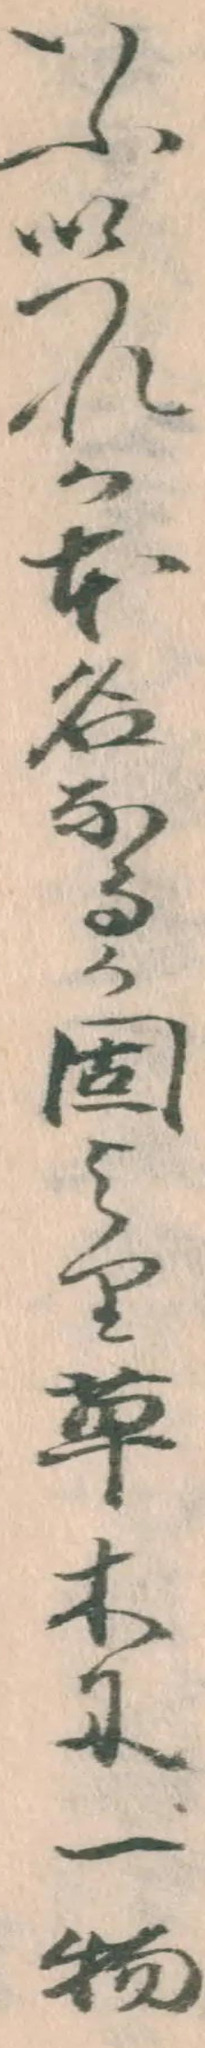いふいつれか本名なるか固より草木にい一物
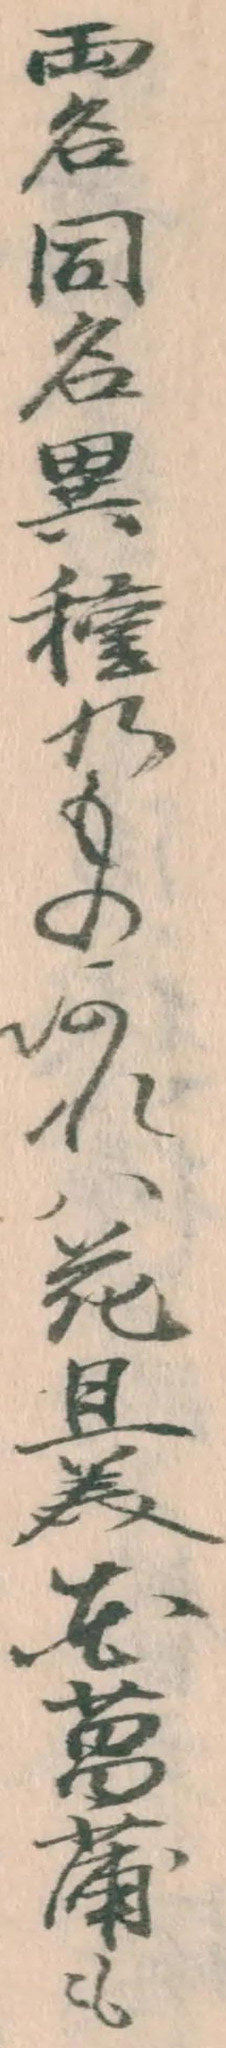両名固名異種のものなハ花且美花菖蒲も
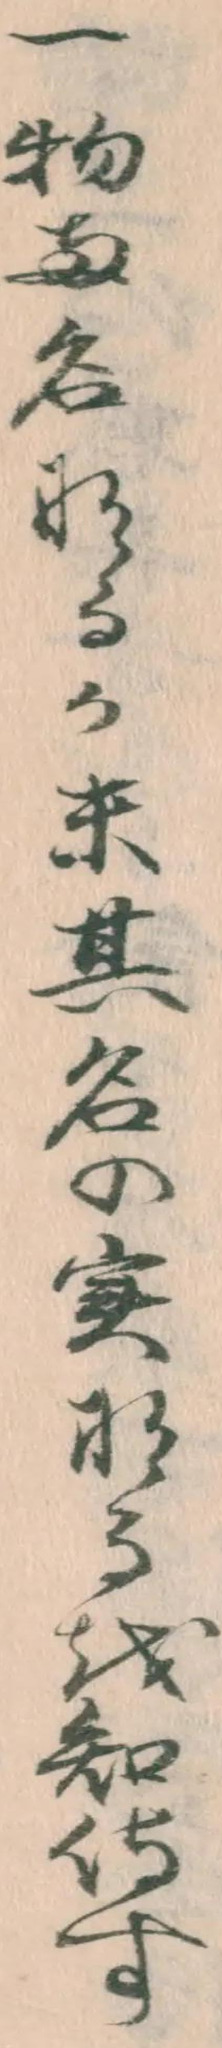一物両名なるか未其名実なるを知伝す
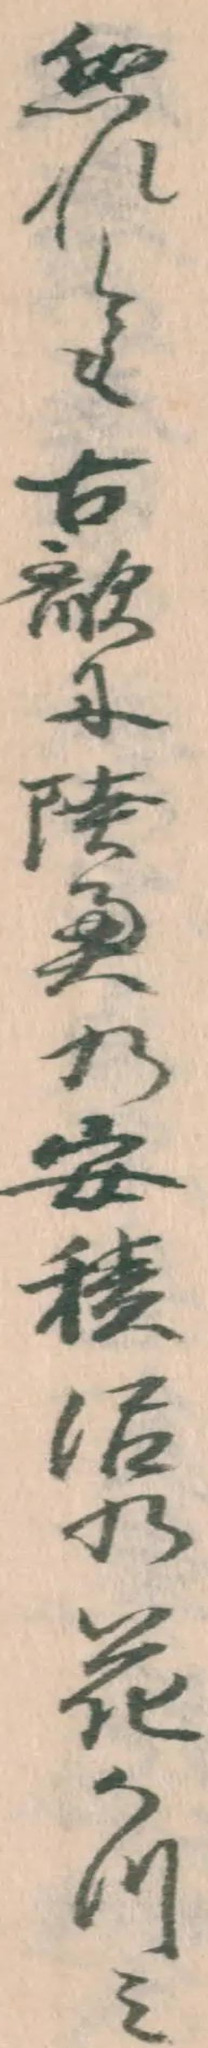然れとも古歌に陸奥の安積沼の花かつミ
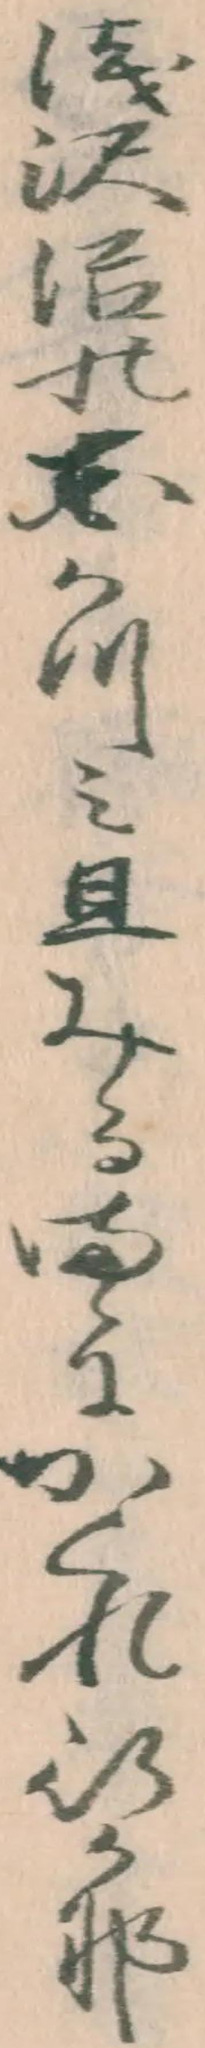浅沢沼の花かつミ且みるまゝかくれ行かな
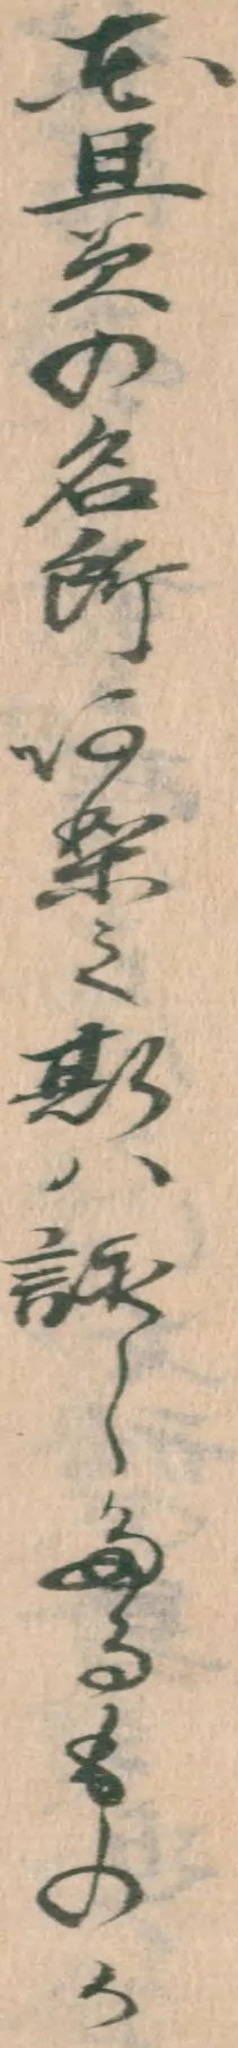花且美の名所ありて斯ハ詠したるものか
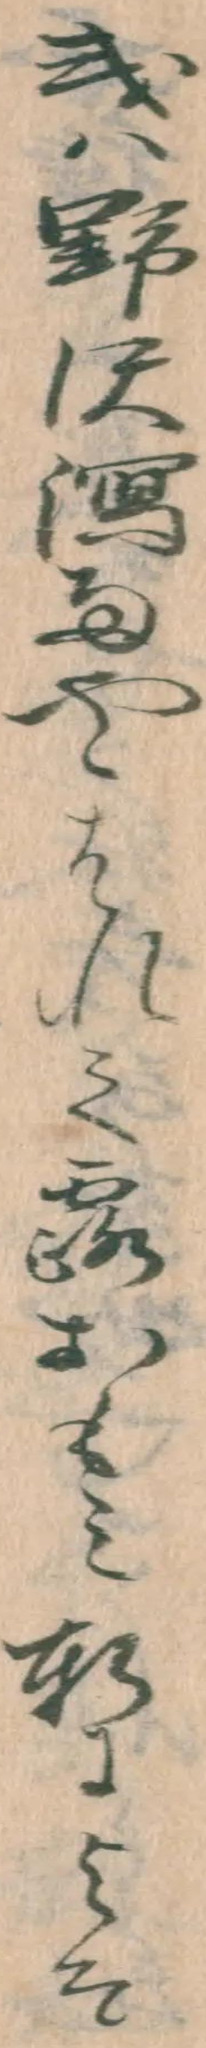或ハ野沢潟雨やゝはれて露おもミ軒にとそ
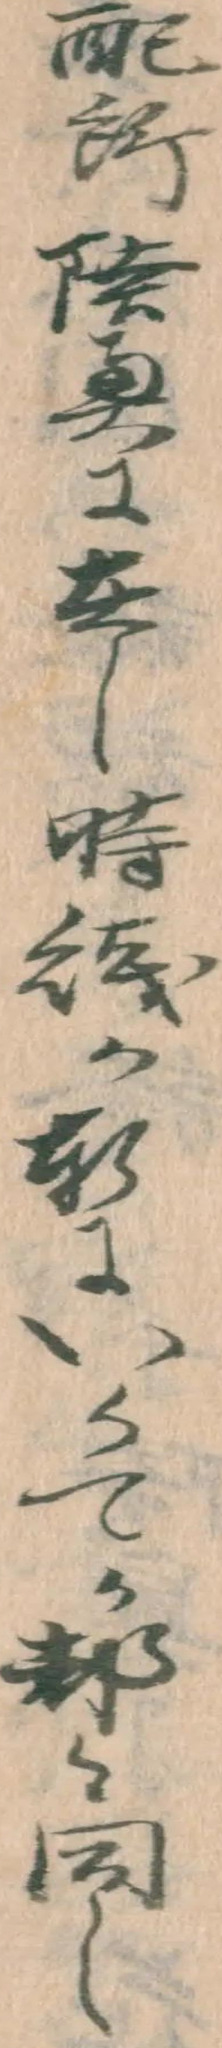配所陸奥に在し時いや賎か軒にいかてか都と同し
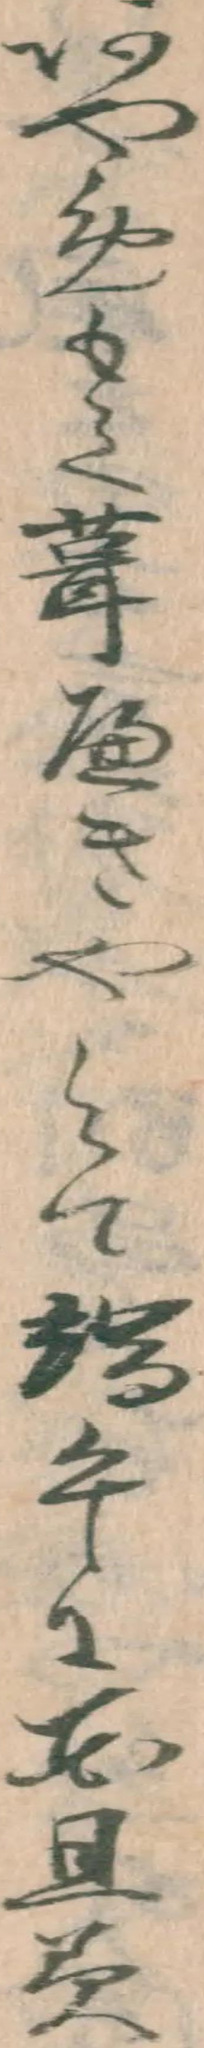あやめもて葺ふきやとて端午に花且美
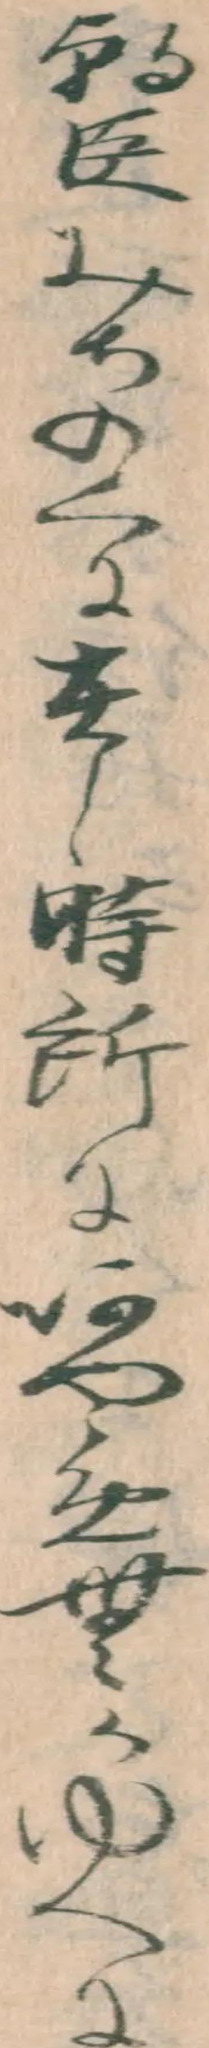朝臣みちのくに在し時所にあやめ無くゆへに
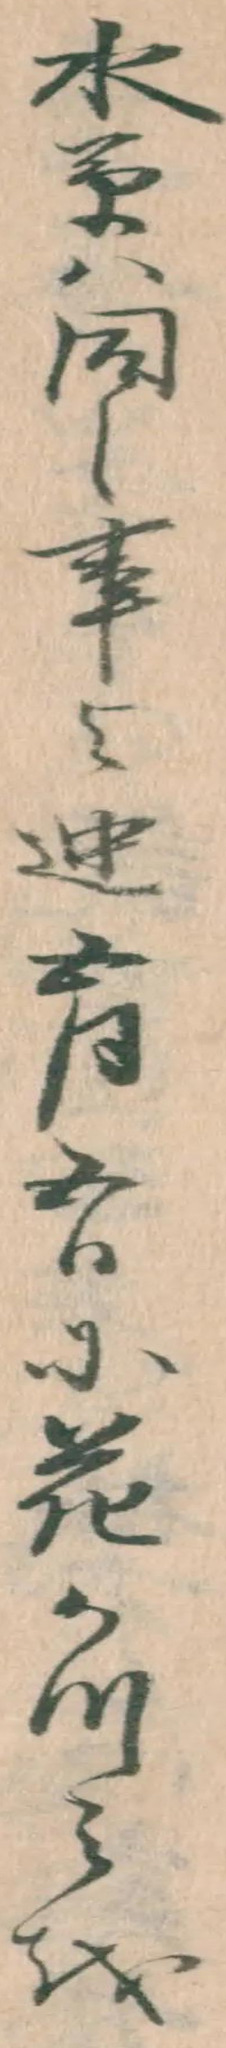水草ハ同じ事とて五月五日に花かつミを
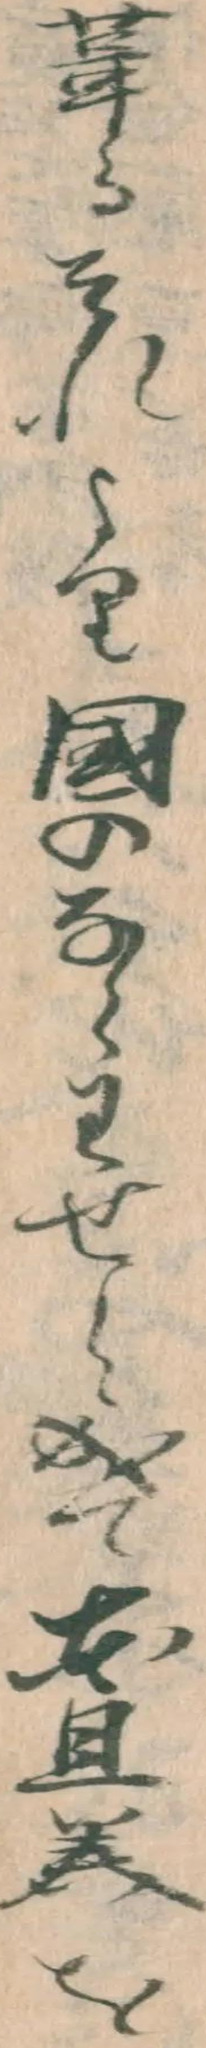葺るそれより国のならわせと成て花且美を
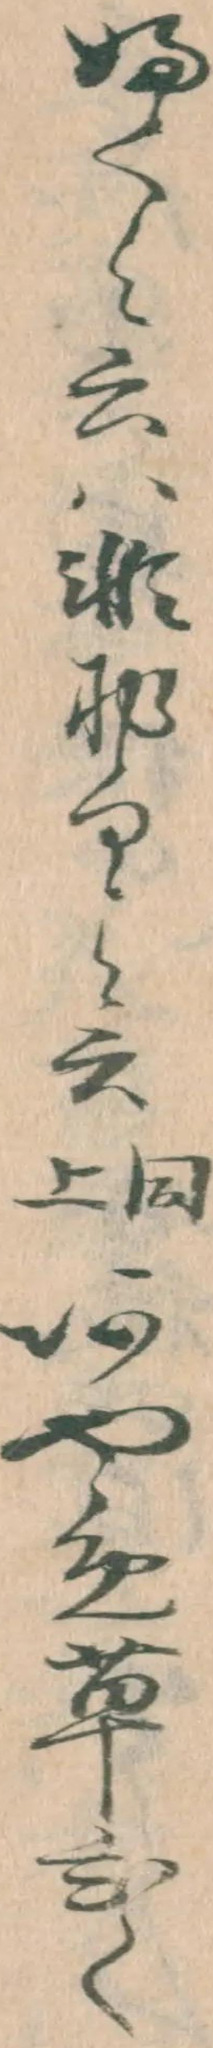ふくと云ハ非なりと云同上あやめ草ひく

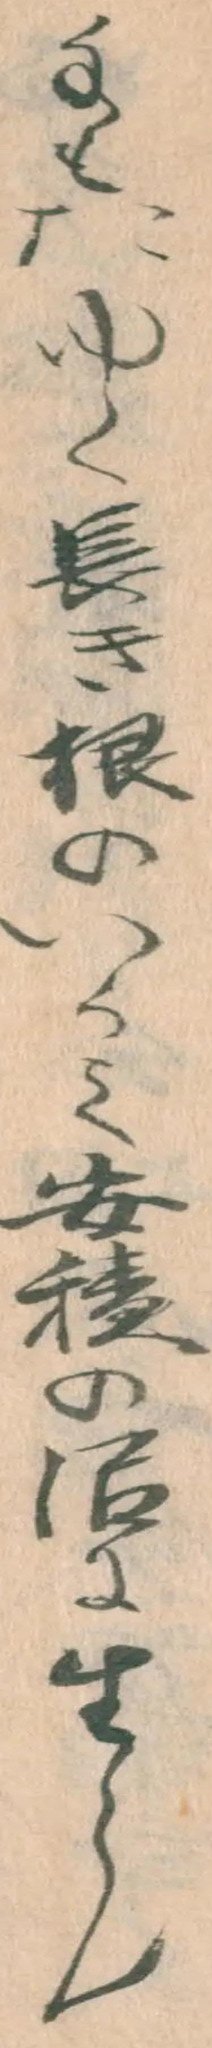手もたゆく長き根のいかて安積の沼に生しん
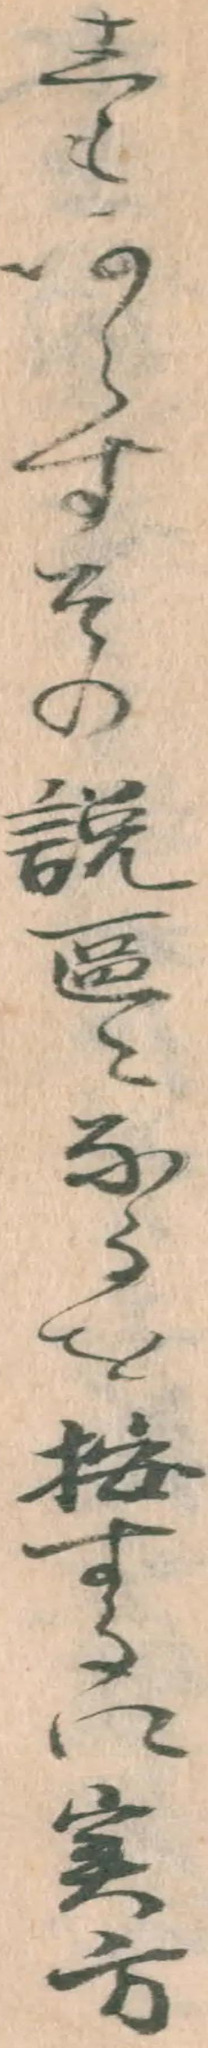しもあらすその説区となるを按するに実方
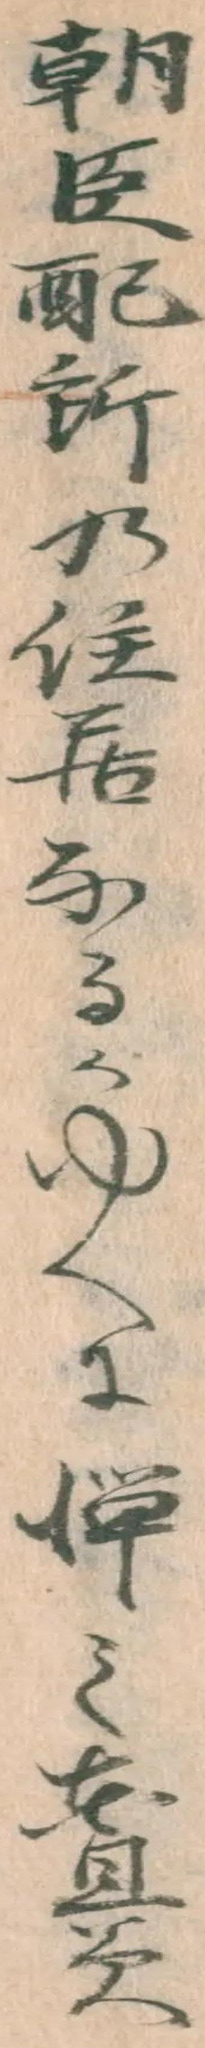朝臣配所の住居なるかゆへに憚て花且美
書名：花菖培養録
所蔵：国立国会図書館 National Diet Library, JAPAN
